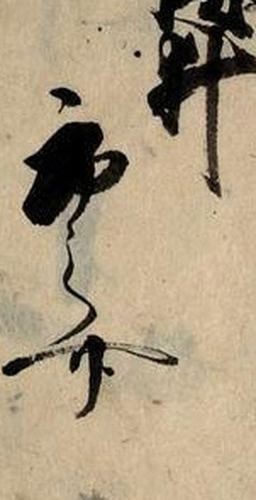市之介
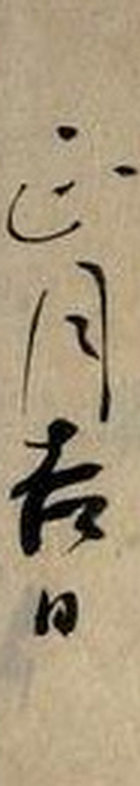正月吉日
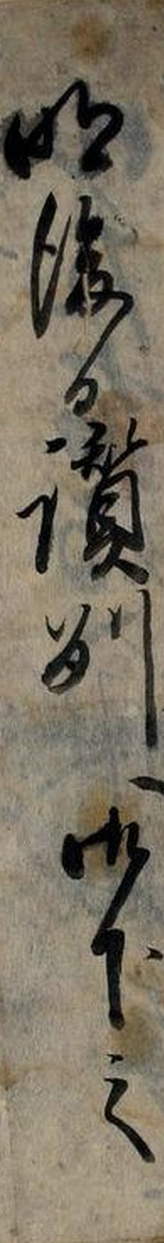明後日讃州へ御下之
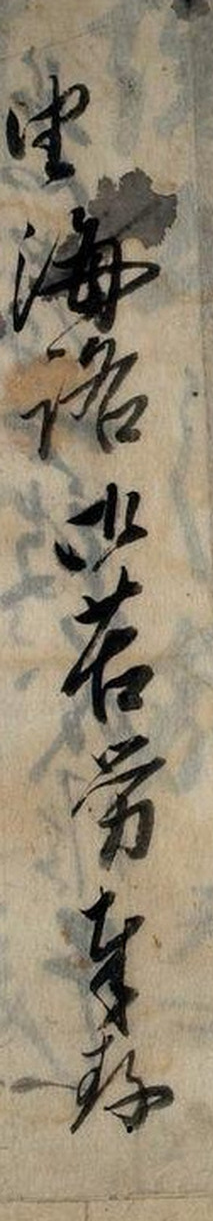由海路御苦労奉存
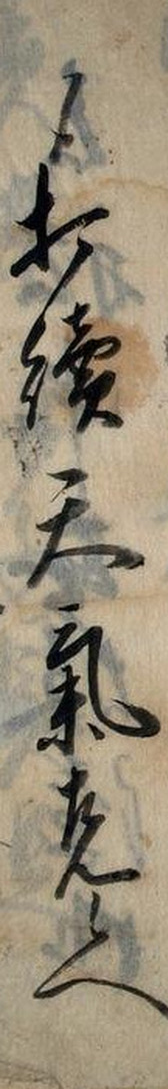候打続天気克候へ

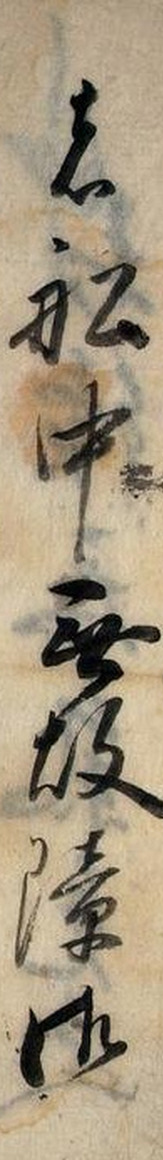は船中無故障御
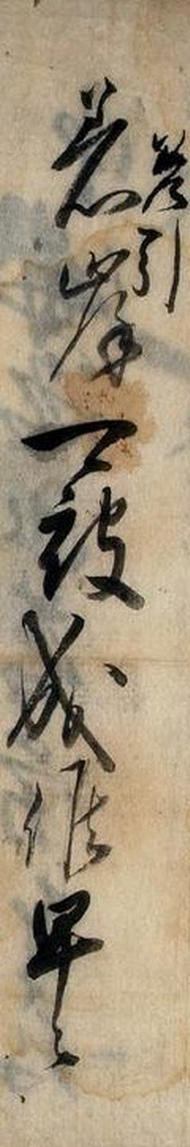着岸可被成候早々
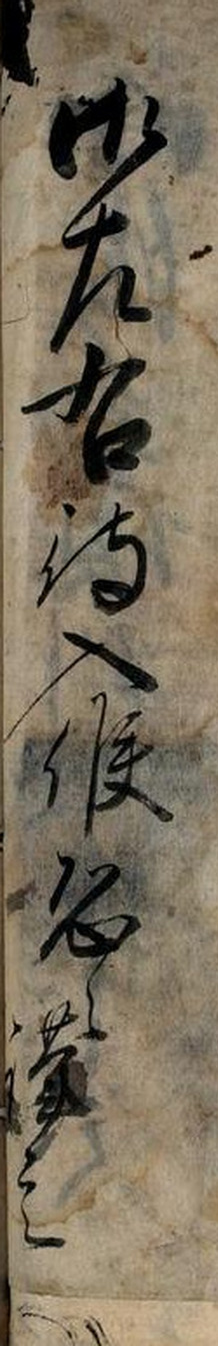御左右待入候恐々謹言
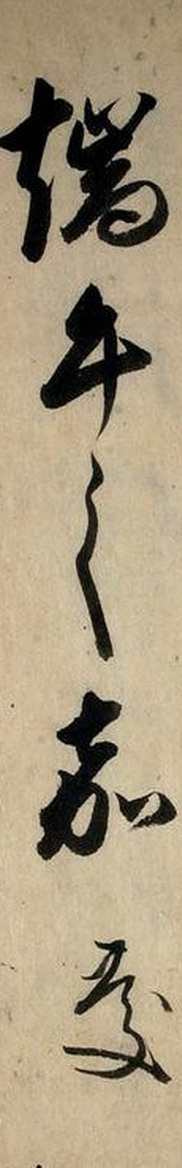端午之嘉慶
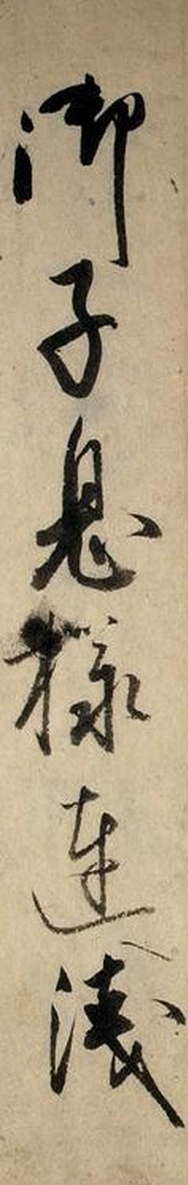御子息様達浅
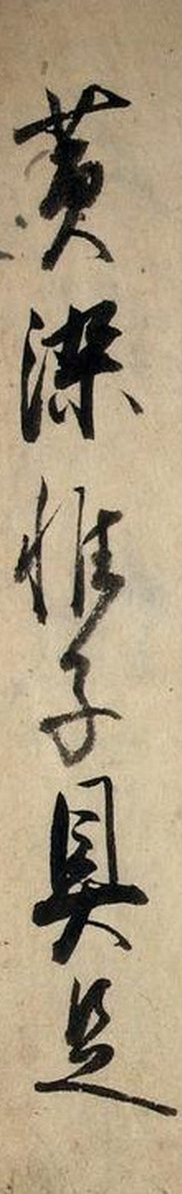黄染帷子具足

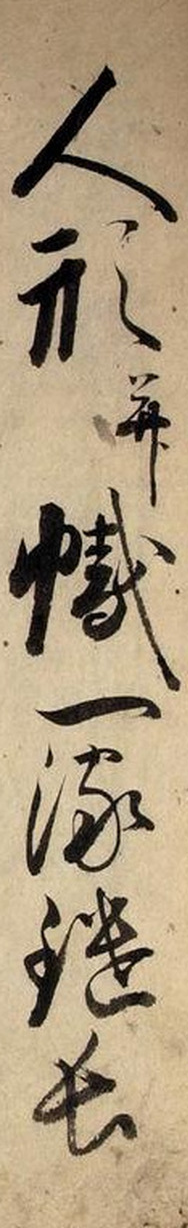人形幷幟一流鑓長
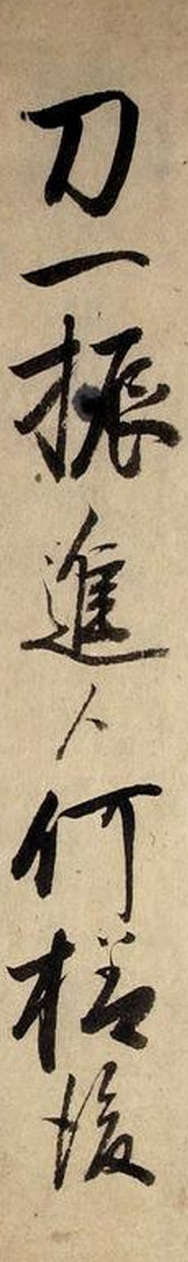刀一振進候何様後
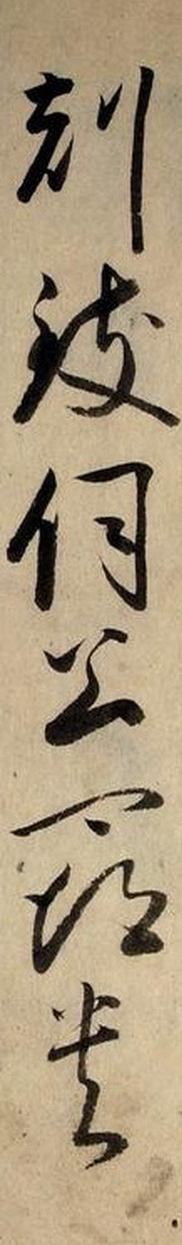刻致伺公可得貴
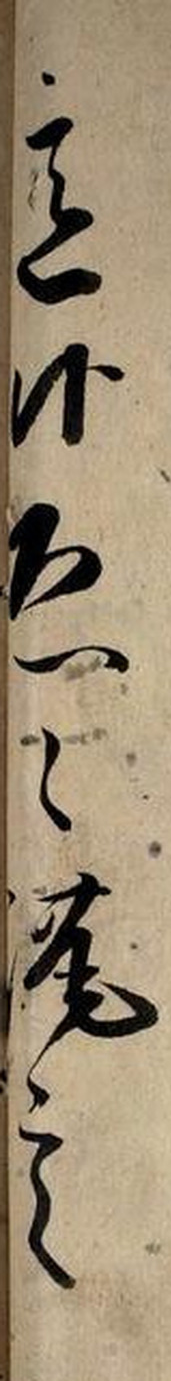意候恐々謹言
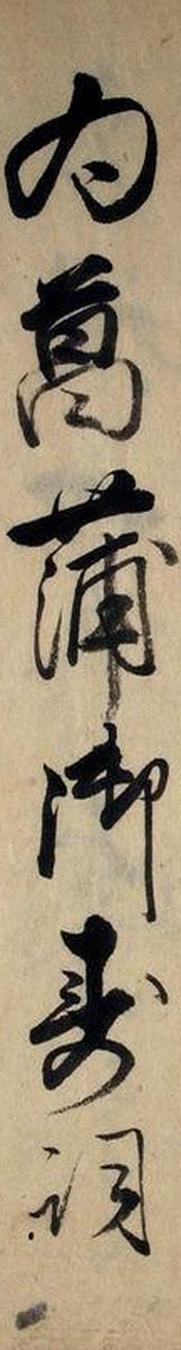為菖蒲御寿詞
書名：御手本（手習、消息文、和漢朗詠集・論語の一節）
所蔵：福井県文書館 Fukui Prefectural Archives
